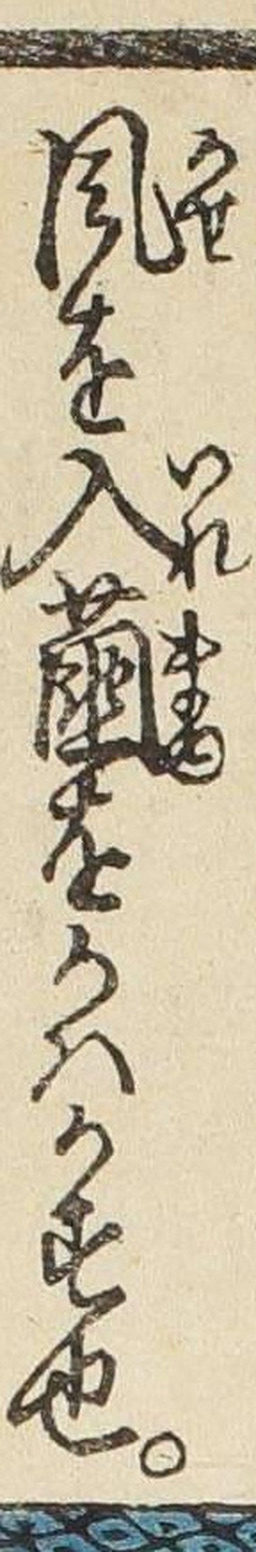風を入繭をかはかす也。
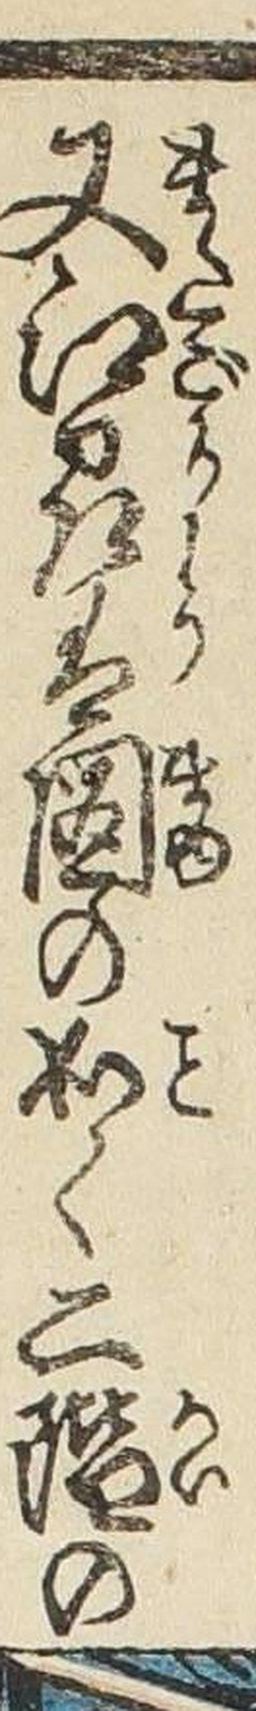又江州は図の如く二階の
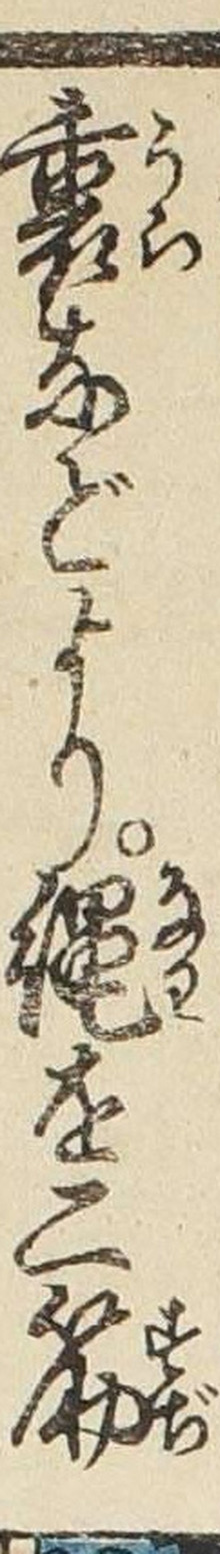裏などより。縄を二筋
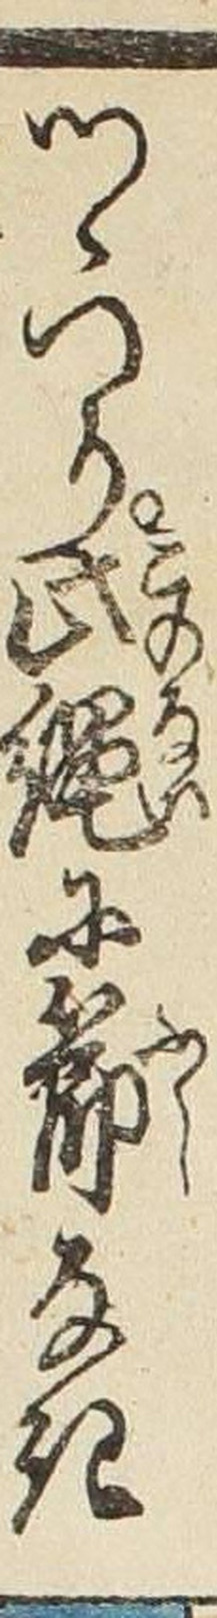つゝつり。此縄に節なき
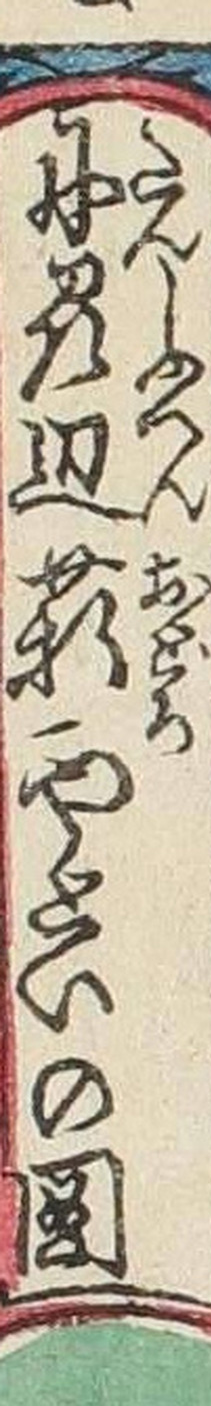丹州辺薪やといの図
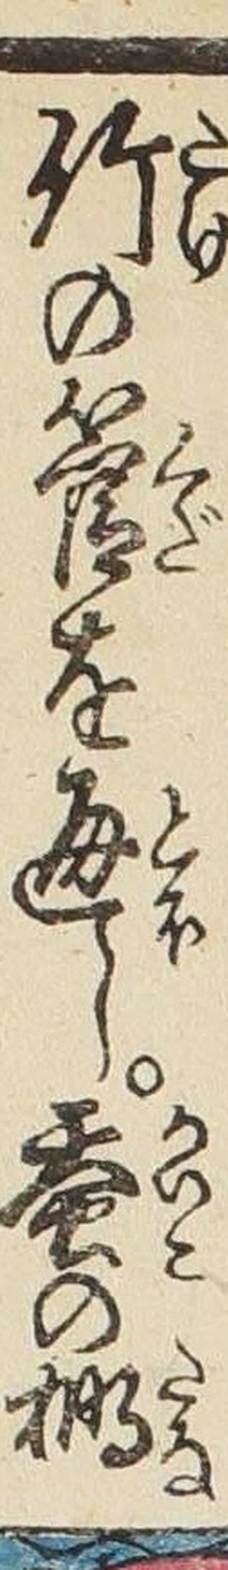竹の管を通し。蚕の棚
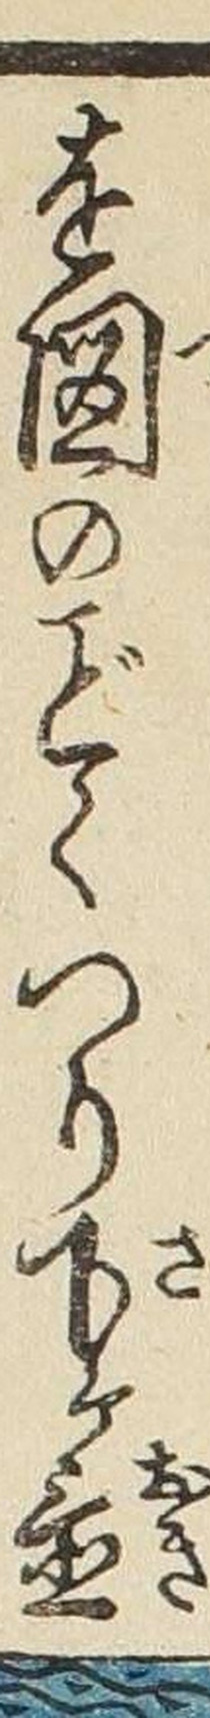を図のごとくつり下ヶ置
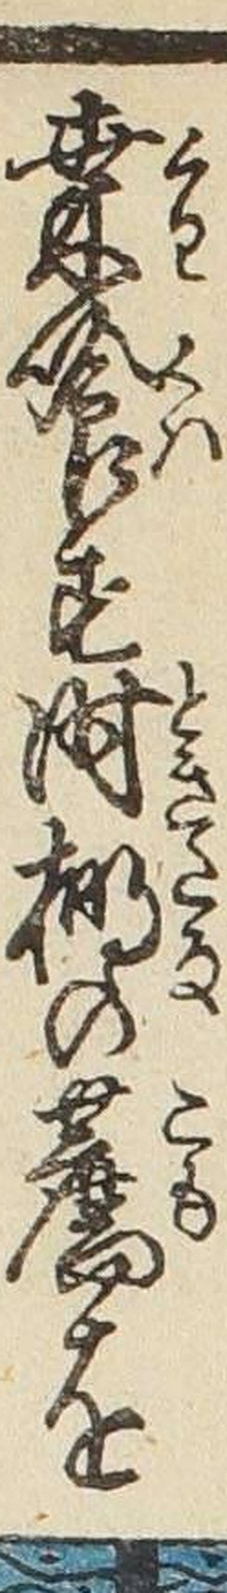桑喰す時棚の薦を
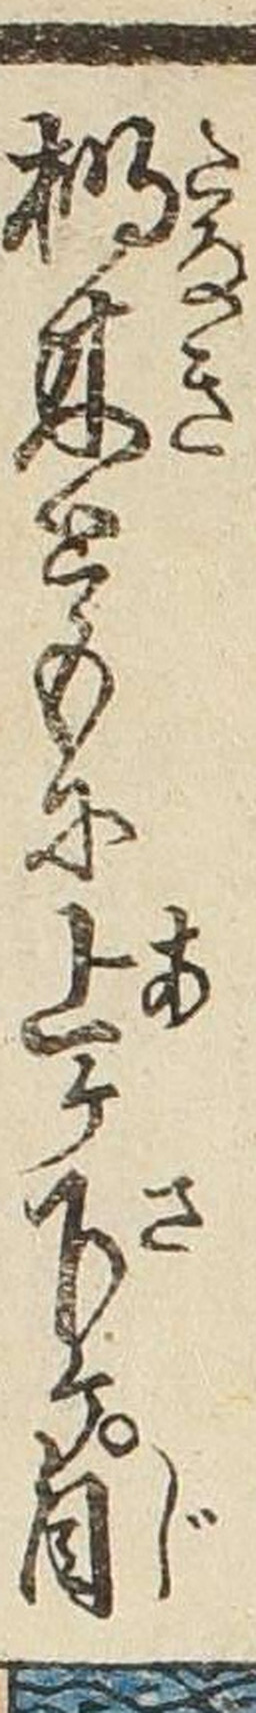棚木ともに上ヶ下ヶ。自
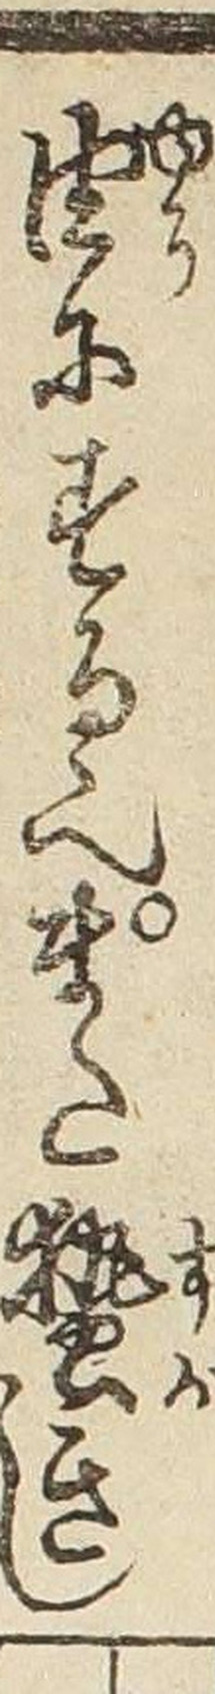由にする也。また蟄きし
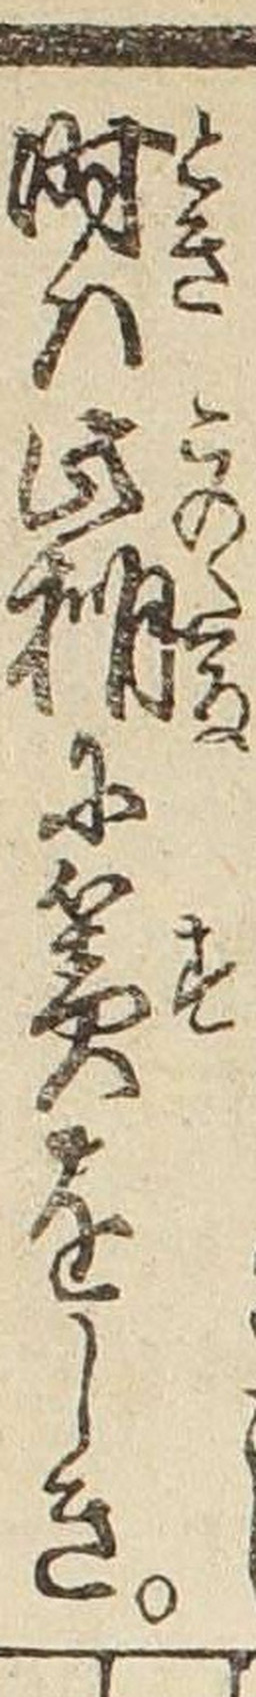時は此棚に簀をしき。

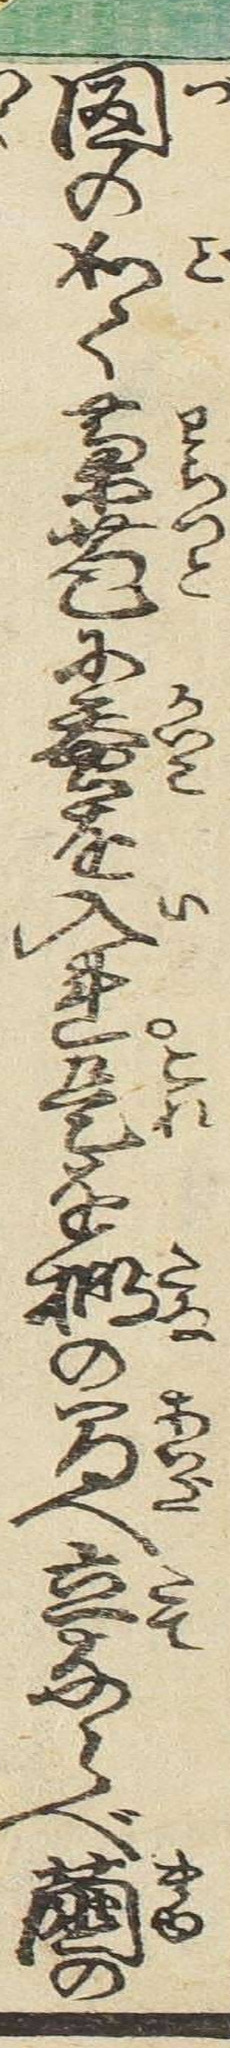図の如く藁苞に蚕を入れ。是を棚の間へ立ならべ繭の
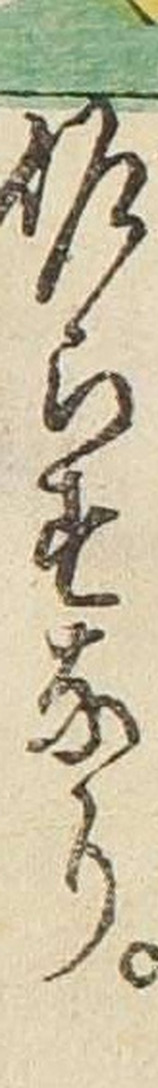作らすなり。
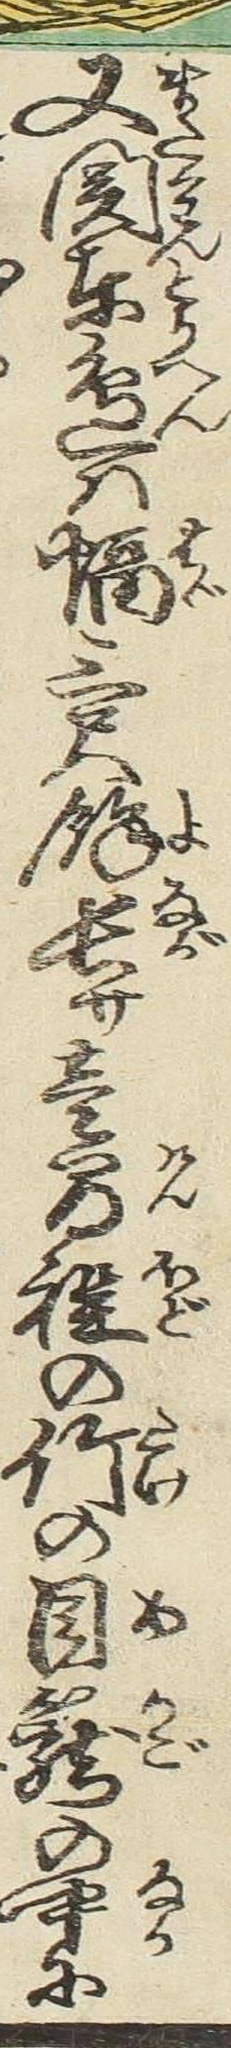又関東辺は幅三尺餘長サ壱間程の竹の目籠の中に
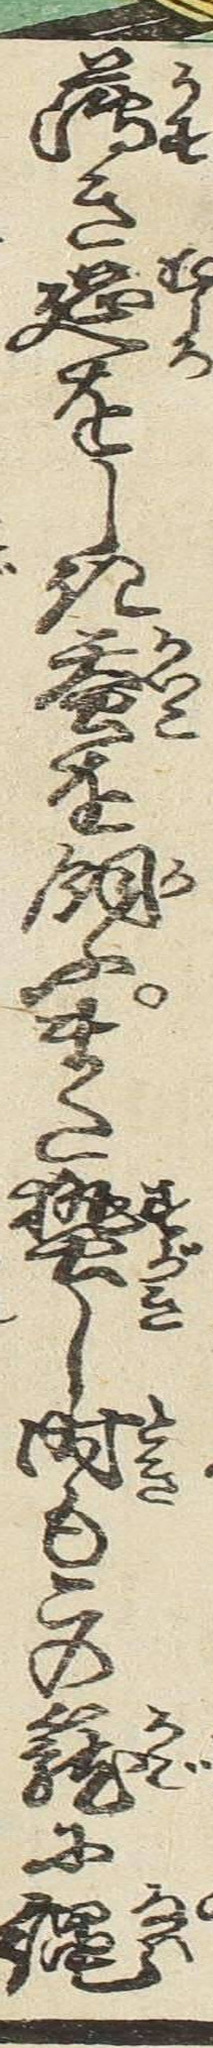薄き莚をしき蚕を飼ふ。また蟄し時もこの籠に縄
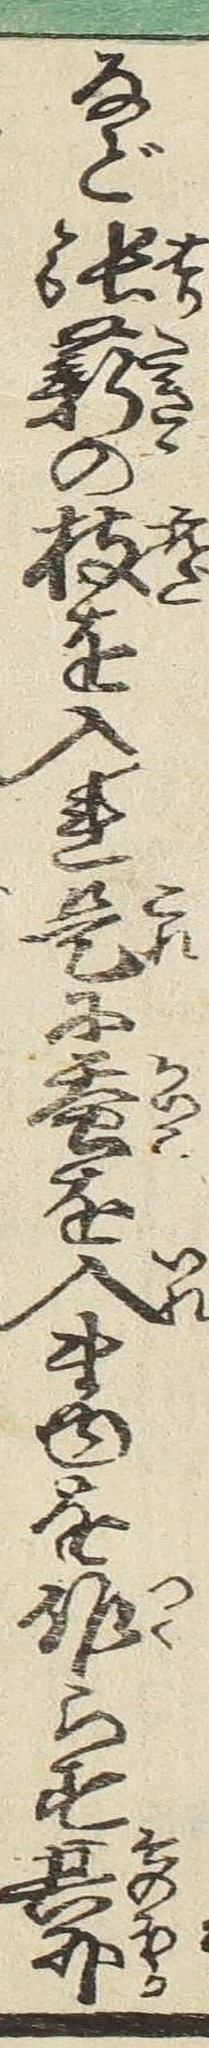など張薪の枝を入れ是に蚕を入まゆを作らす其外
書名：養蠶圖解
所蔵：東京大学農学生命科学図書館 国文学研究資料館
